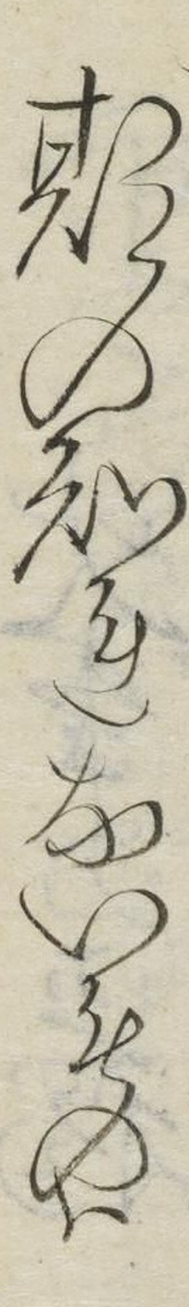期の知れないものハ
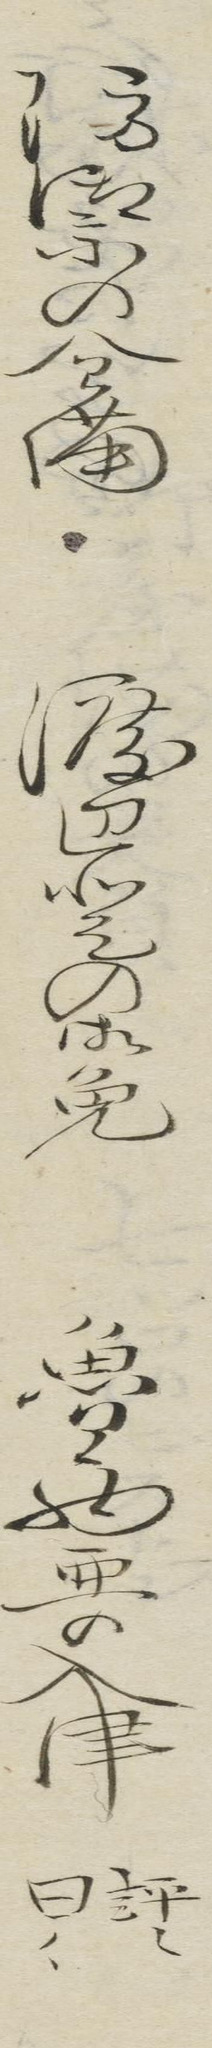防禦の全備渡辺登の御免露西亜の入津評ニ
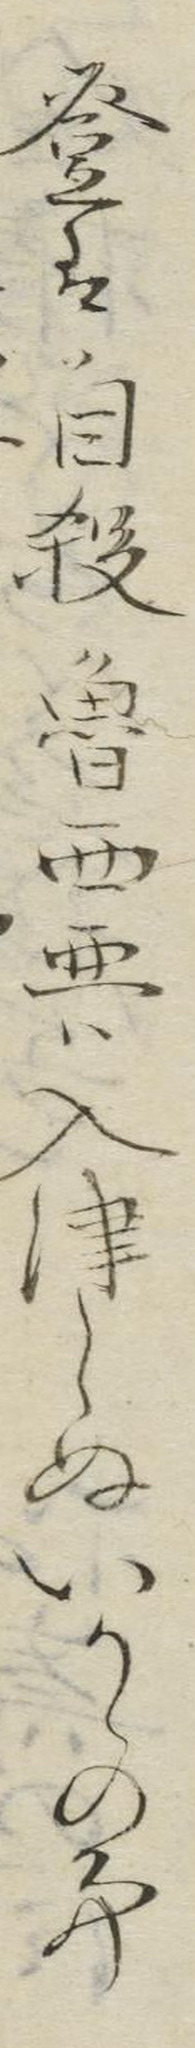登は自殺露西亜ハ入津しぬいかがの事
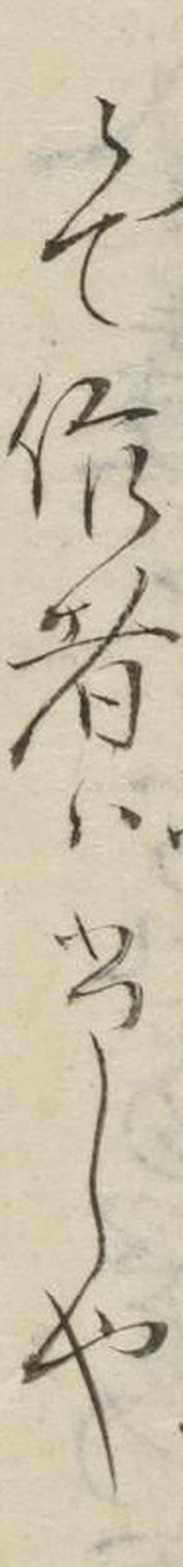ニて作者ハ書しや
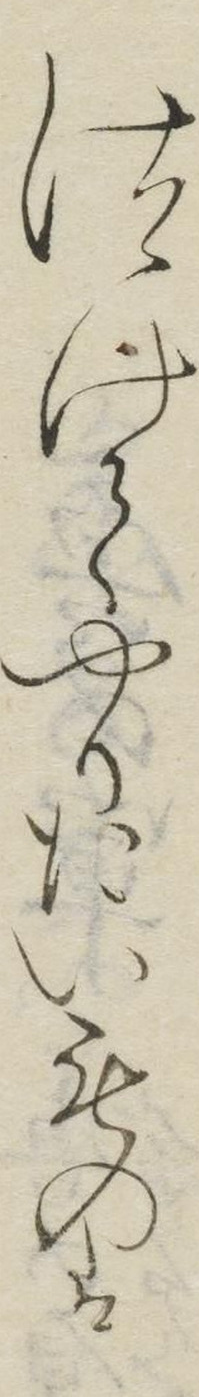つけてやりたいものは
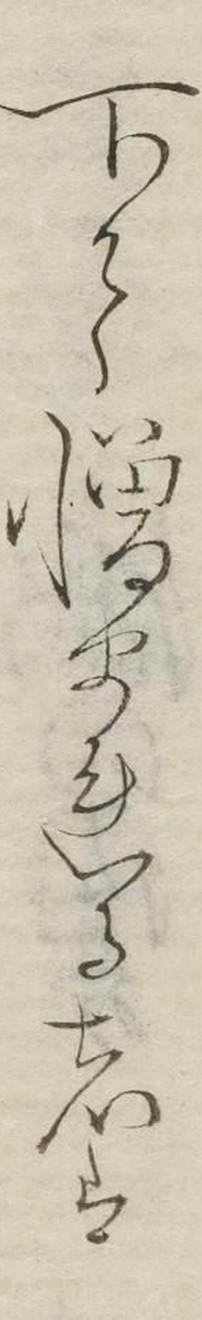下々に憎まれる者は
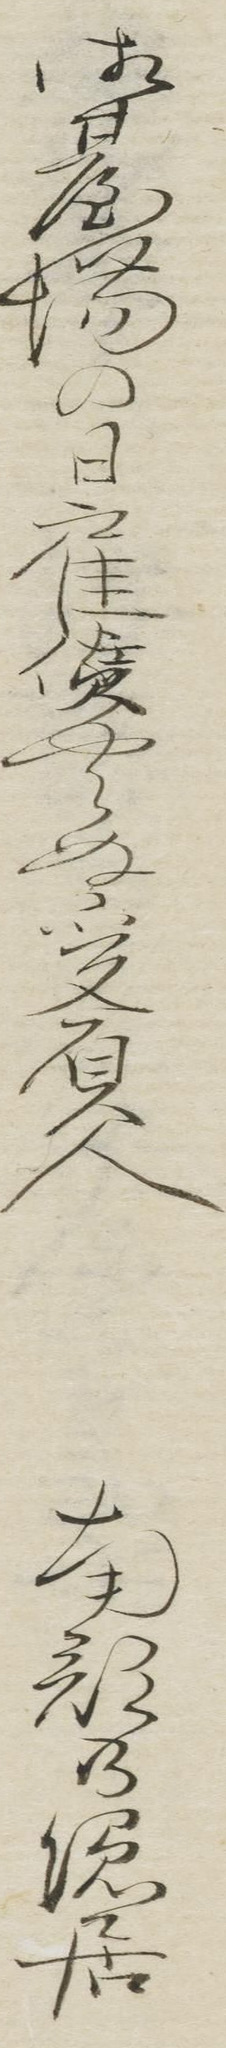お台場の日雇賃やらぬ受負人南部の隠居
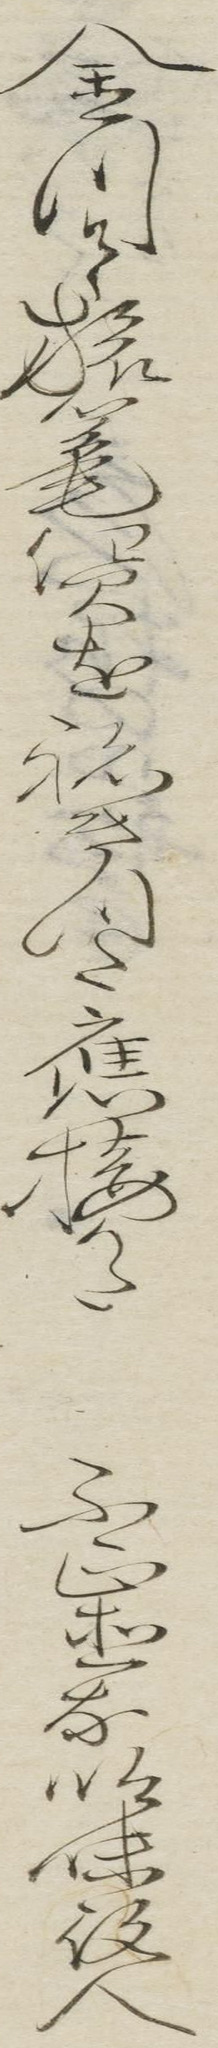金つき旅籠鎮をねきつた応接かた不正直な吟味役人
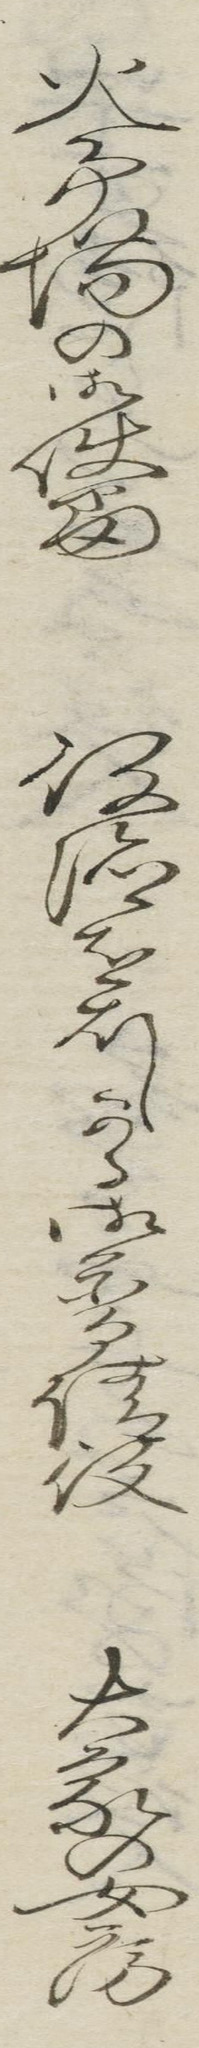火事場の御使番役徳をほしかる御普請役大家の女房
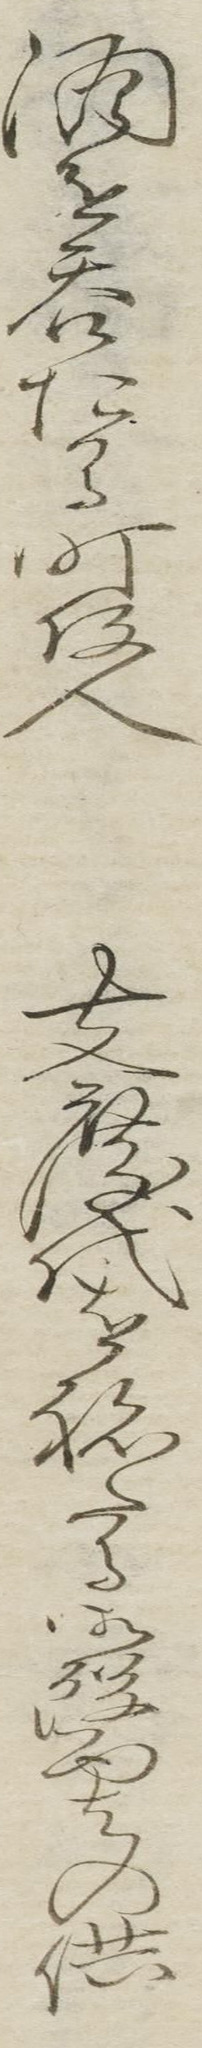酒を呑たる町役人支度代をねたる医者の供
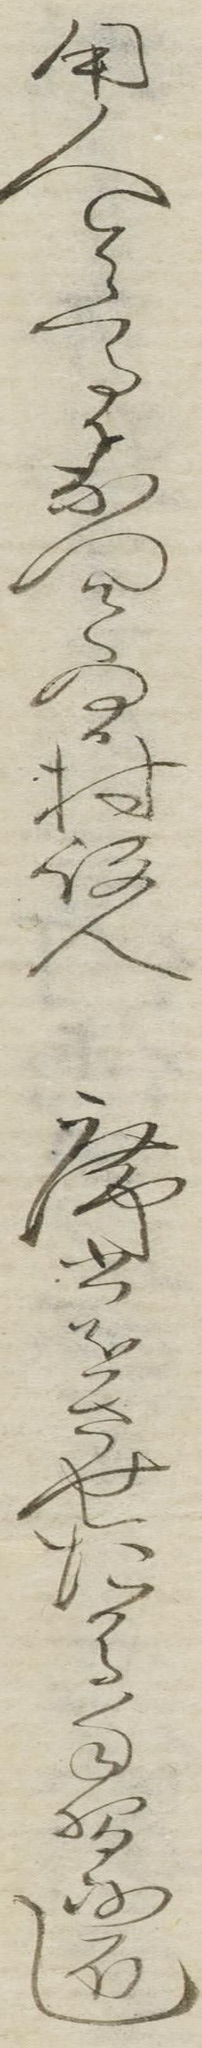用人として事をなつけゐる村役人席書をさせたかる手習師匠

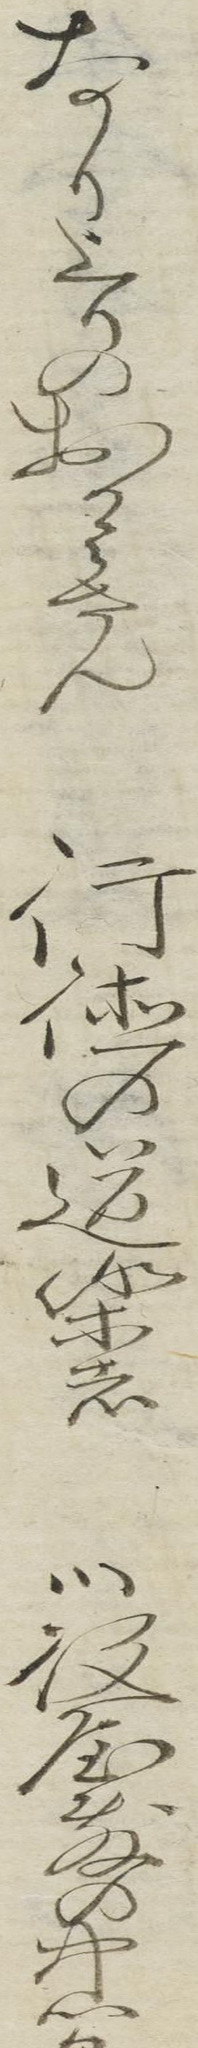なり上りのおかミさん行徳の道楽者御役屋敷の中間
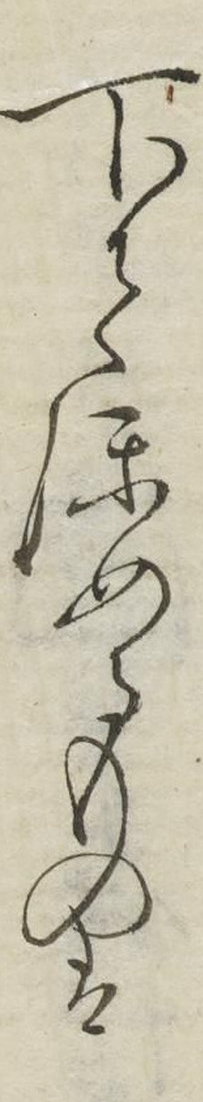下でほめるものは
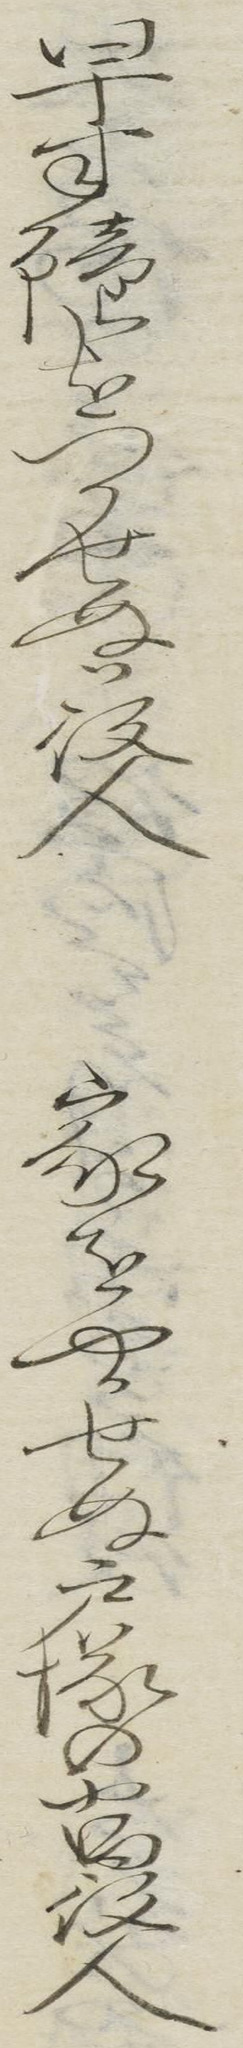早く半鐘をつかせぬ御役人家をやかせぬ戸塚の火消役人
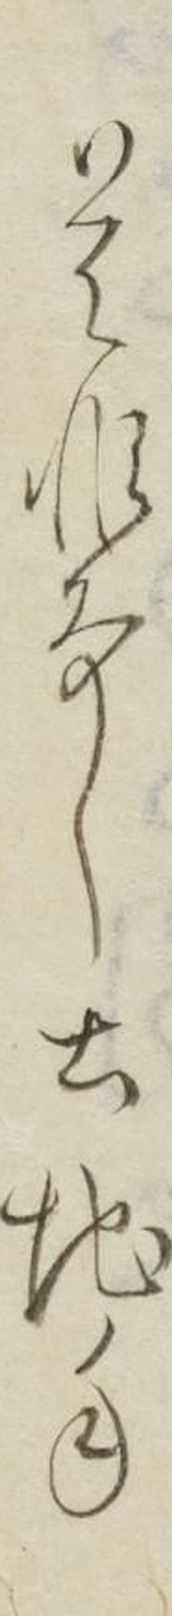是非なし大地手
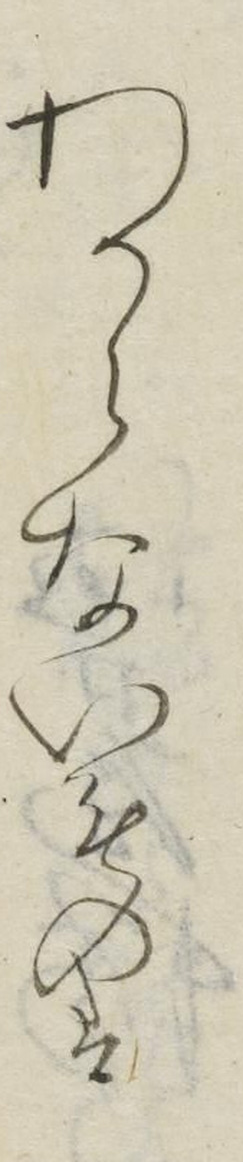ゐらないものは
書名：大地震實録
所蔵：東京大学地震研究所図書室 Earthquake Research Institute Library, The University of Tokyo, JAPAN
